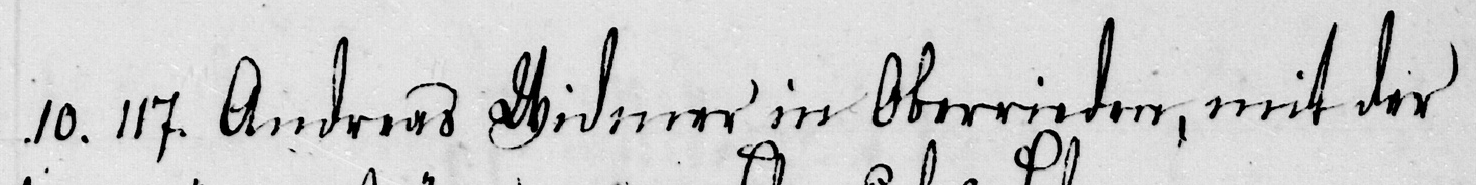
10. 117. Andreas Widmer in Oberrieden, mit der
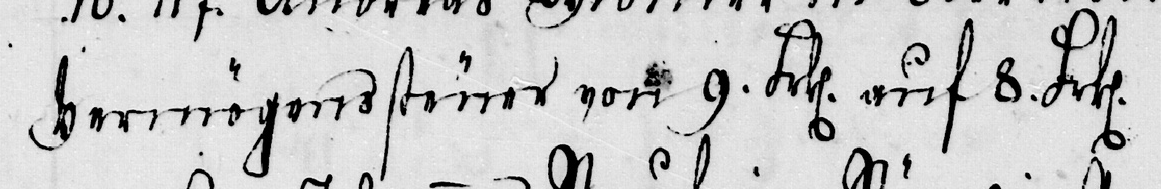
Vermögenssteuer von 9. Frk[en]. auf 8. Frk[e¬
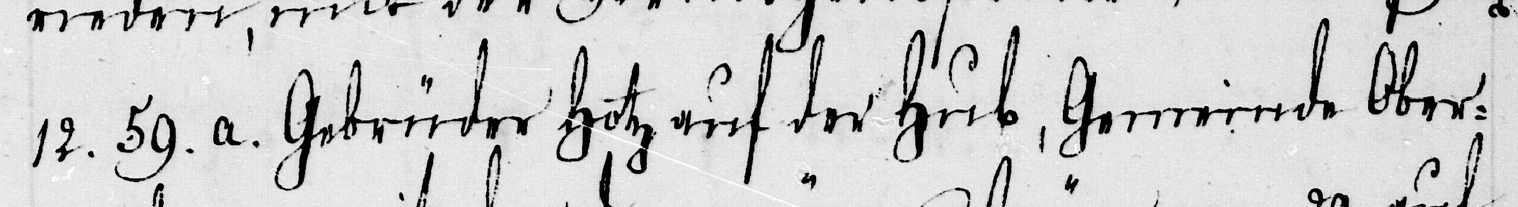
12. 59. a. Gebrüder Hotz auf der Hub, Gemeinde Ober¬
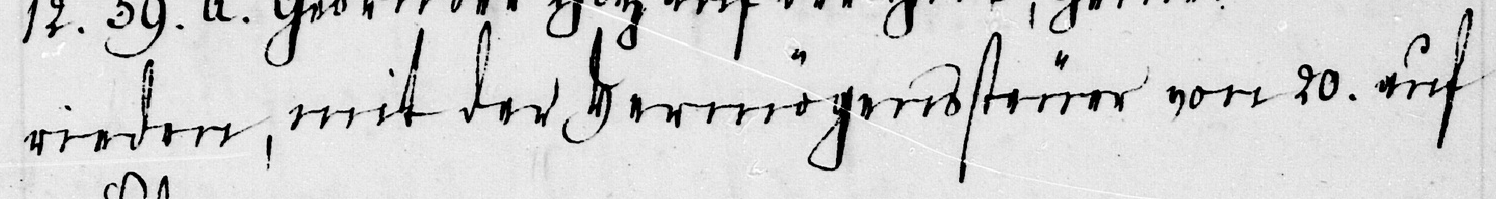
rieden, mit der Vermögenssteuer von 20. auf
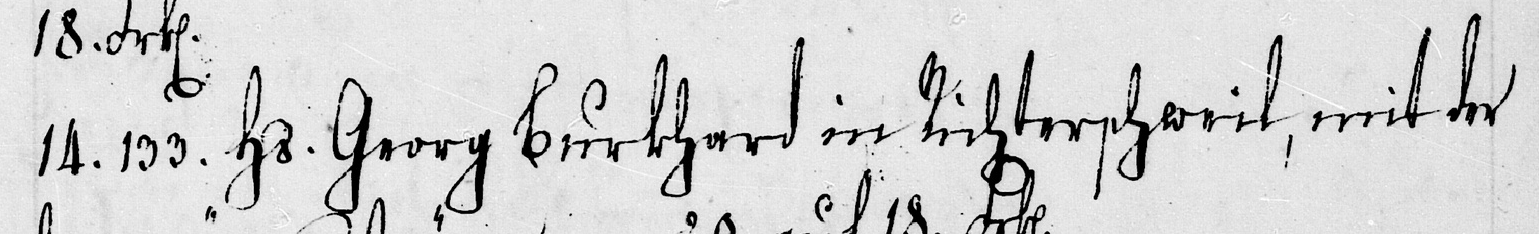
14. 133. Hs. Georg Burkhard in Richterschweil, mit der
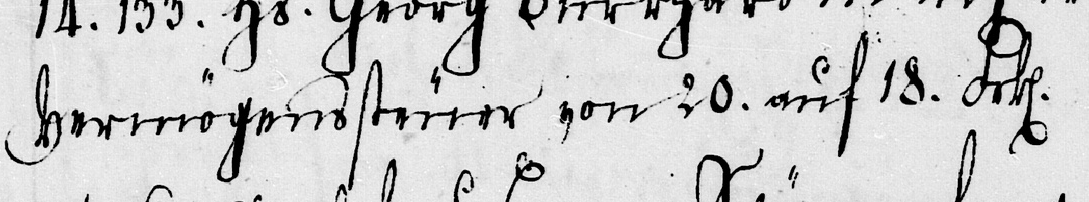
Vermögenssteuer von 20. auf 18. Frk[e¬
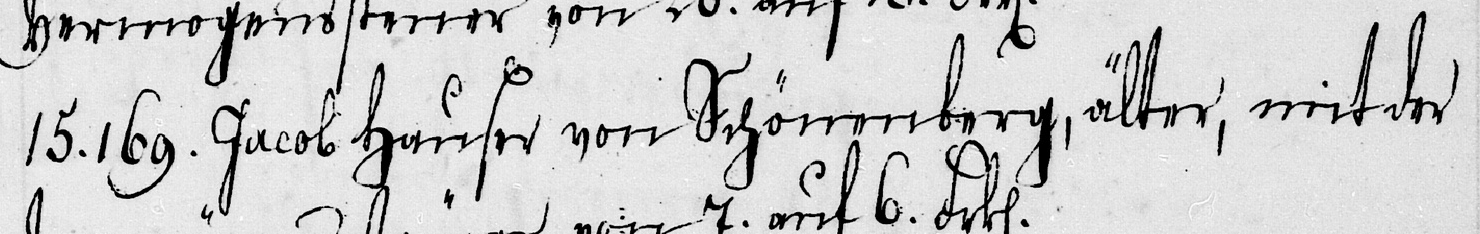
15. 169. Jacob Hauser von Schönenberg, älter, mit der
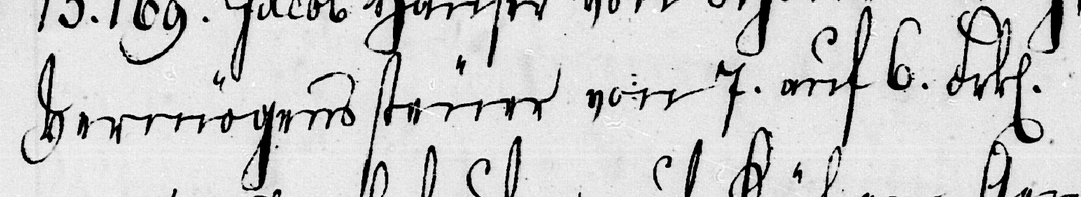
Vermögenssteuer von 7. auf 6. Frk[e¬
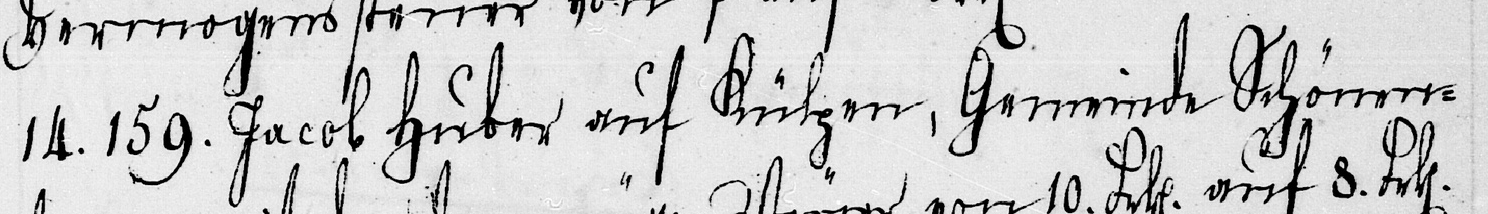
14. 159. Jacob Huber auf Külpen, Gemeinde Schönen¬
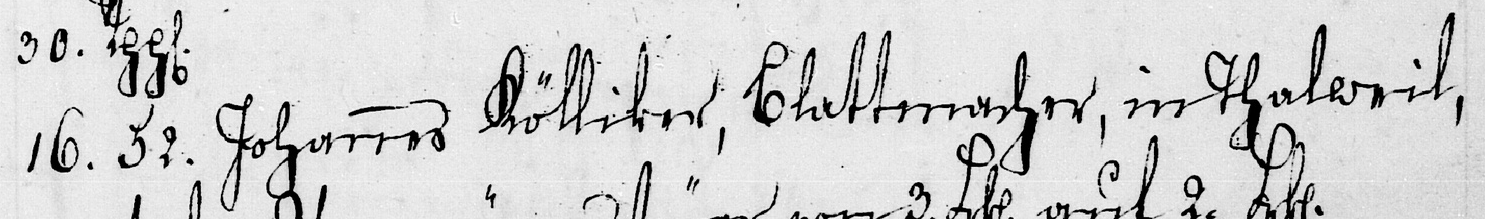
16. 52. Johannes Kölliker, Blattmacher, in Thalweil,
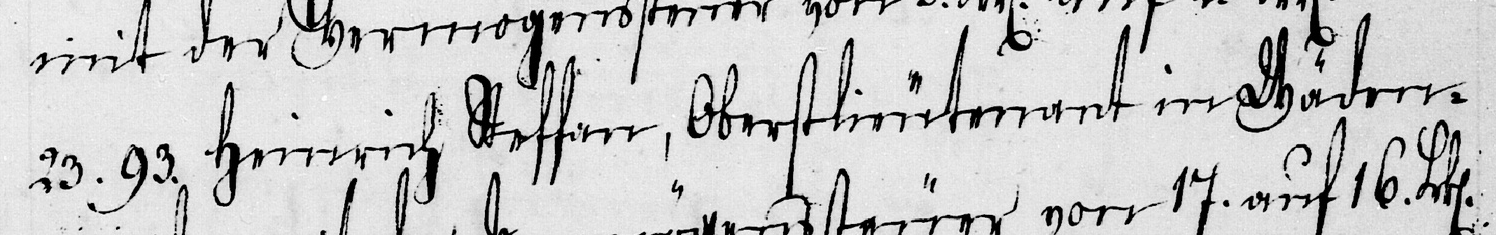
23. 93. Heinrich Steffan, Oberstlieutenant in Wäden¬
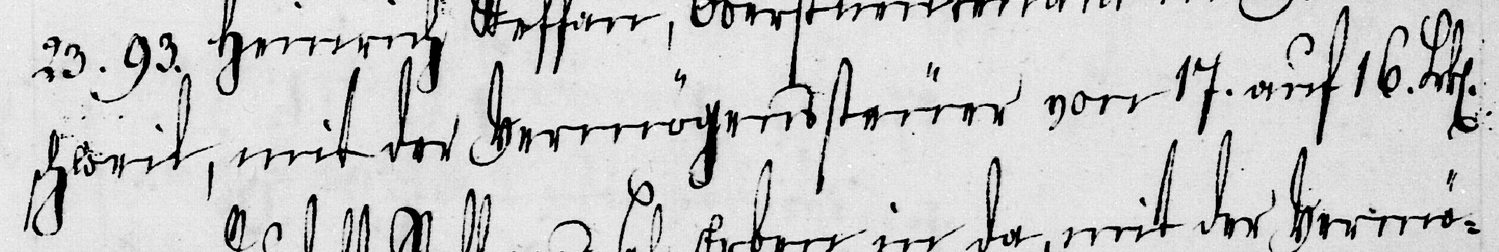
schweil, mit der Vermögenssteuer von 17. auf 16. Fr¬
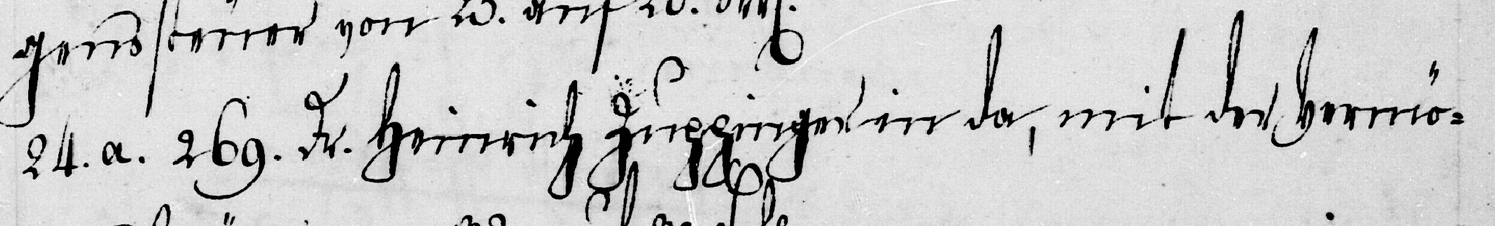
24. a. 269. Dr. Heinrich Zuppinger in da, mit der Vermö¬
